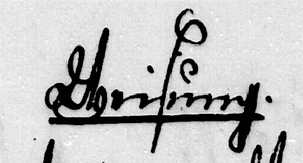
Weisung.
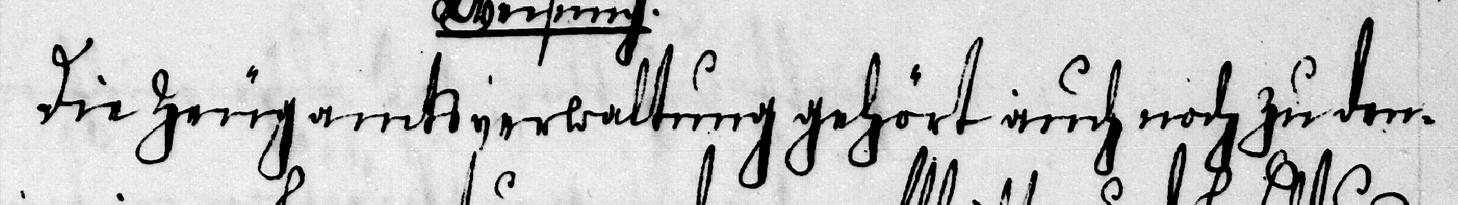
Die Zeugamtsverwaltung gehört auch noch zu den¬
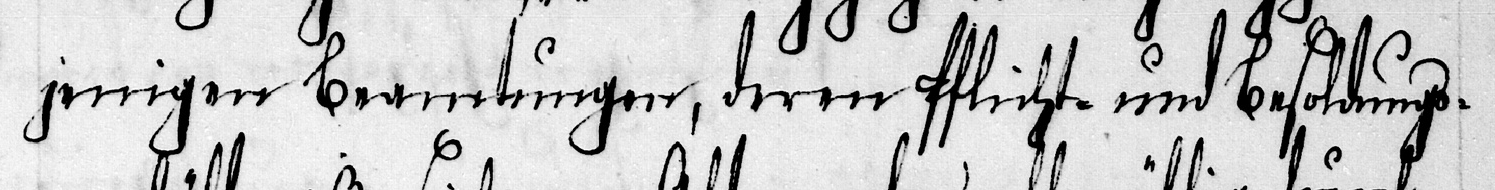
jenigen Beamtungen, deren Pflicht- und Besoldungs¬
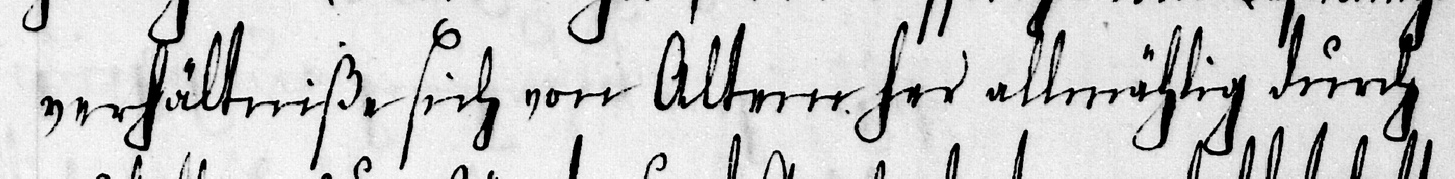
verhältniße sich von Altem her allmählig durch
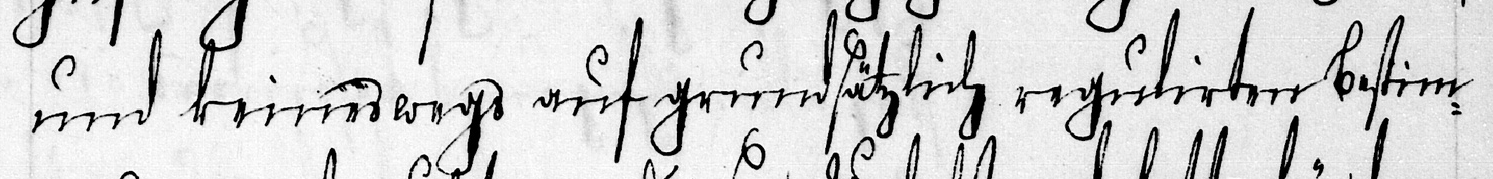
und keineswegs auf grundsätzlich regulirten Bestim¬
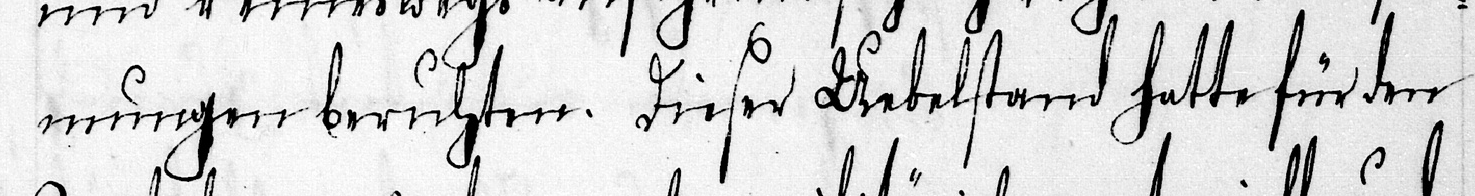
mungen beruhten. Dieser Uebelstand hatte für den
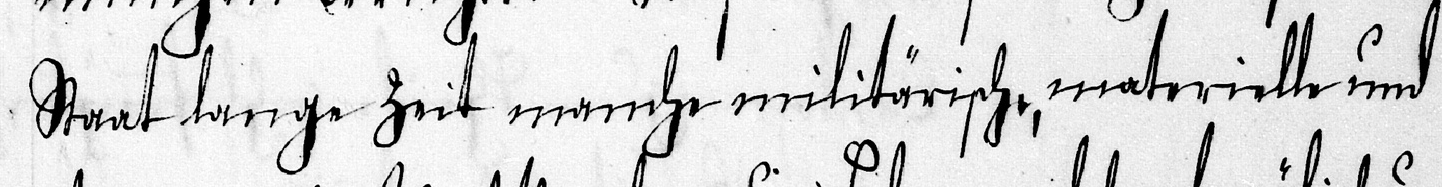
Staat lange Zeit manche militärische, materielle und
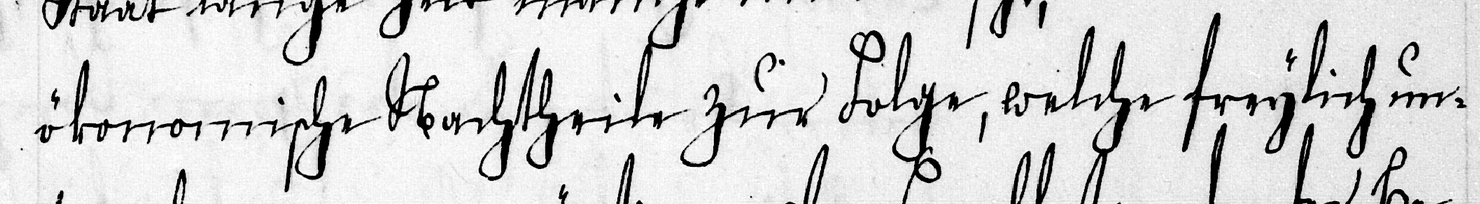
ökonomische Nachtheile zur Folge, welche freylich un¬
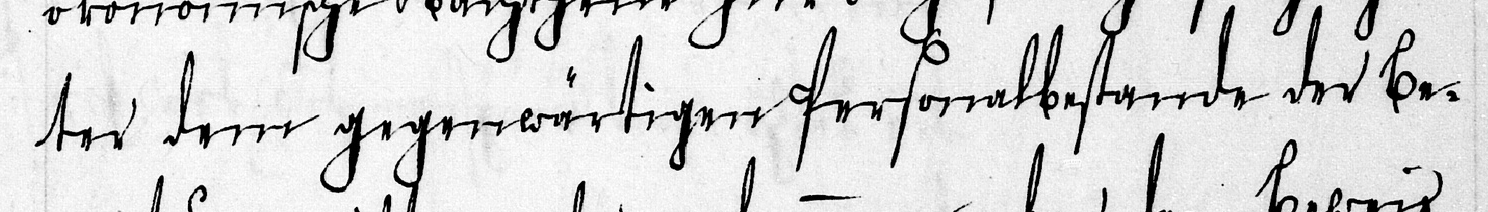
ter dem gegenwärtigen Personalbestande der Be¬
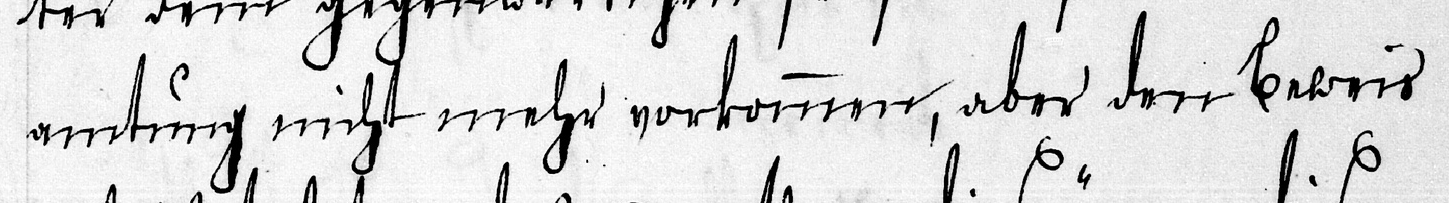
amtung nicht mehr vorkommen, aber den Beweis
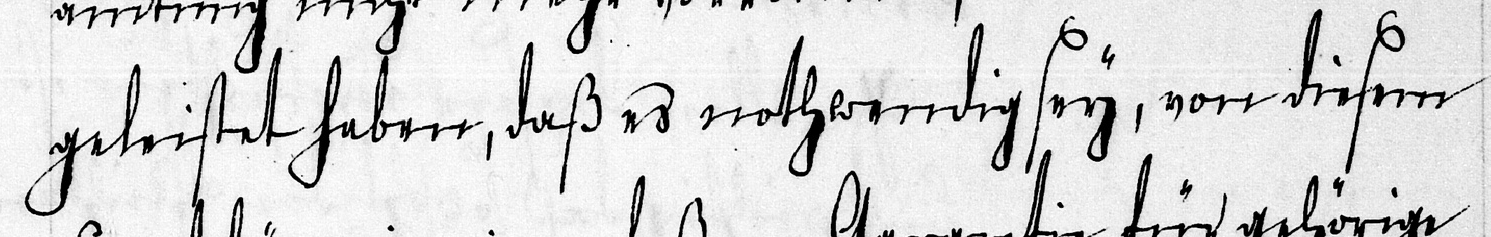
geleistet haben, daß es nothwendig sey, von diesem
